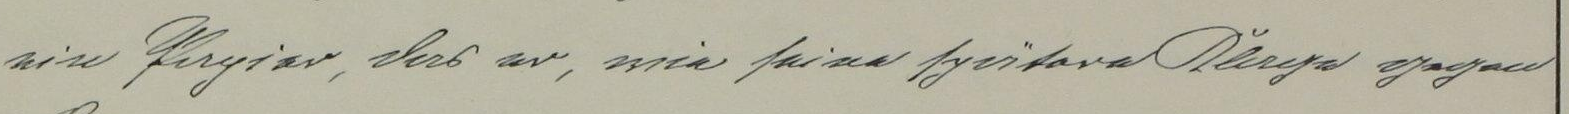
ein Papier, das er, wie seine spätere Klage gegen
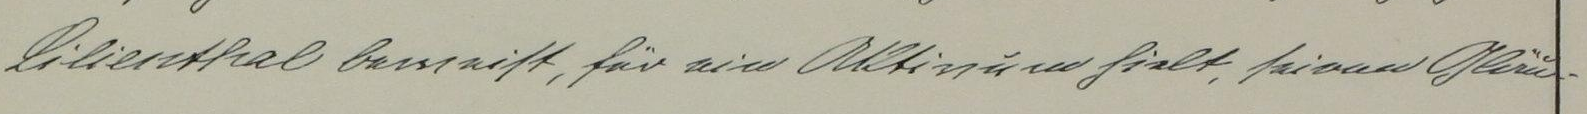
Lilienthal beweist, für ein Aktivum hielt, seinen Gläu-
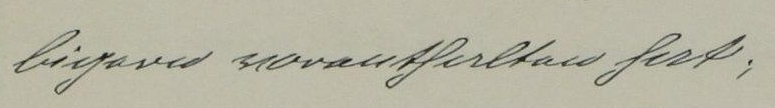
bigern vorenthalten hat;
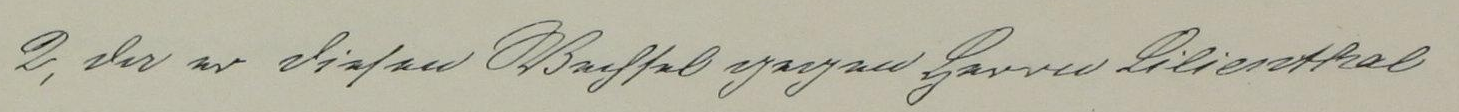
2. da er diesen Wechsel gegen Herrn Lilienthal
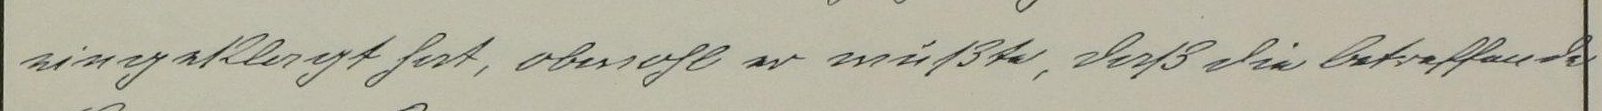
eingeklagt hat, obwohl er wußte, daß die betreffende
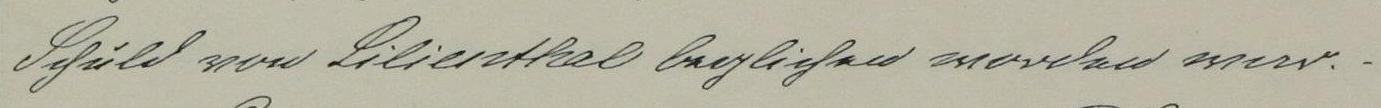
Schuld von Lilienthal beglichen worden war.
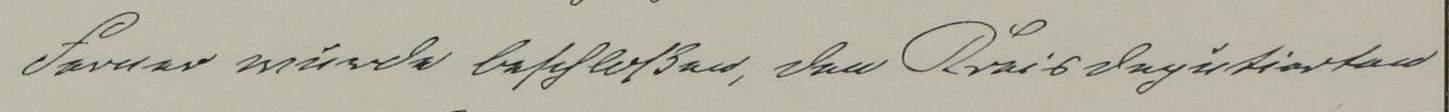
Ferner wurde beschloßen, den Kreisdeputierten
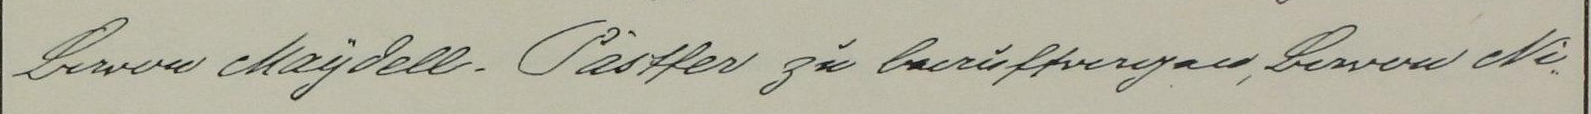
Baron Maydell-Pastfer zu beauftragen, Baron Ni-
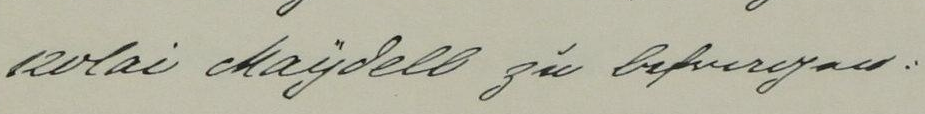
kolai Maydell zu befragen:
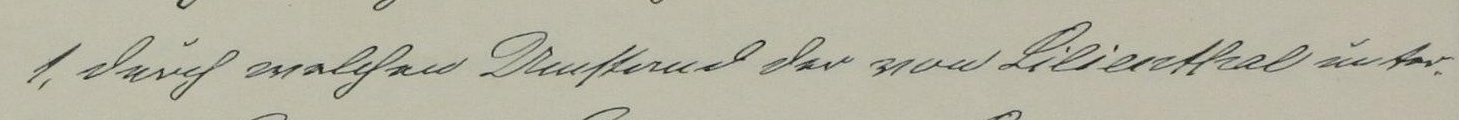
1. durch welchen Umstand der von Lilienthal unter-
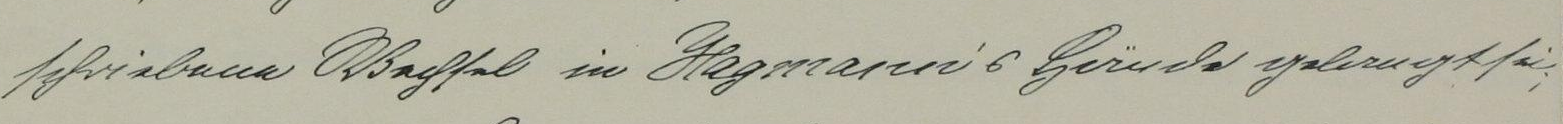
schriebene Wechsel in Hagmannʼs Hände gelangt sei;
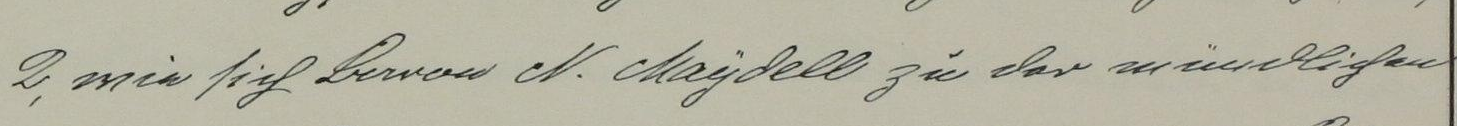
2. wie sich Baron N. Maydell zu der mündlichen
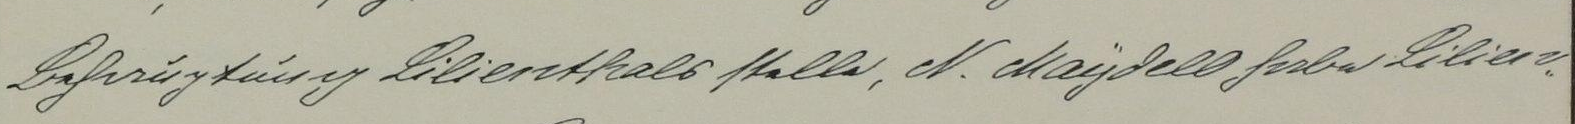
Behauptung Lilienthals stelle, N. Maydell habe Lilien-
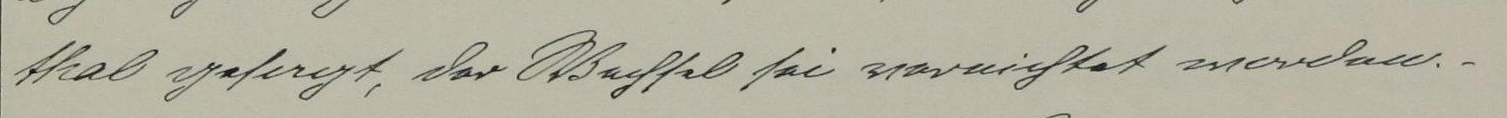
thal gesagt, der Wechsel sei vernichtet worden.
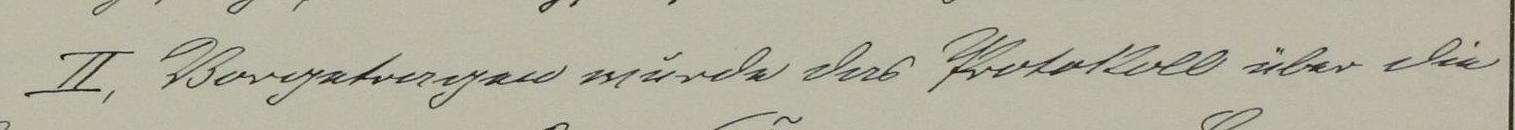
II. Vorgetragen wurde das Protokoll über die
